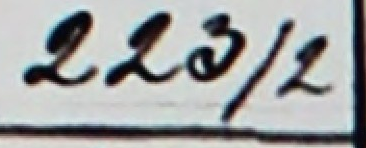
223/2
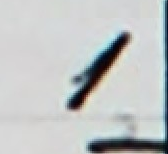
1
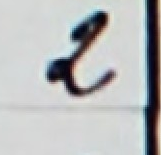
2
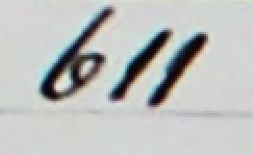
611
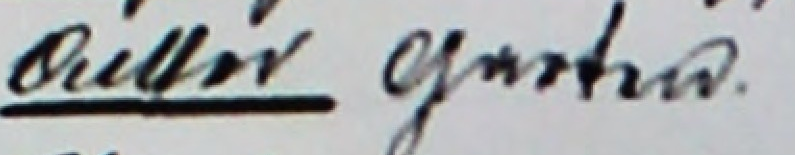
Outter Garten.
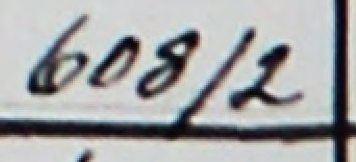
608/2
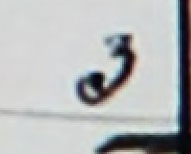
3
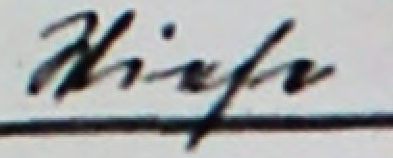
Wiese
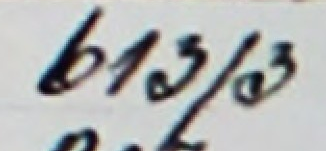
613/3
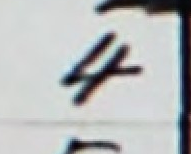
4
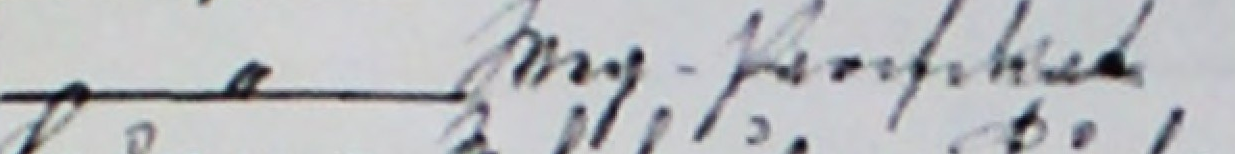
„ Weg - Parefekeit
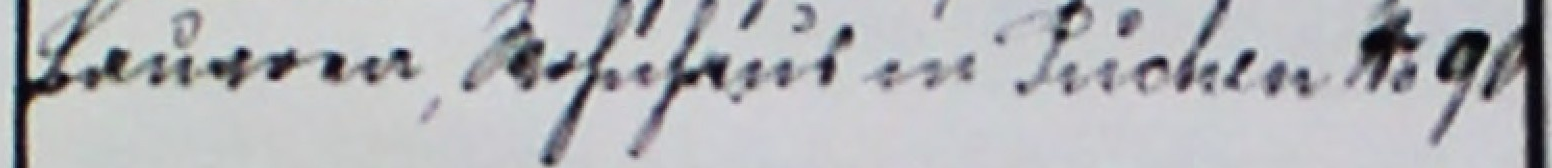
Bauarea, Wohnhaus in Puchen No 90
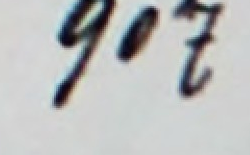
907
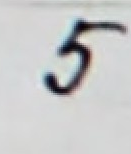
5
